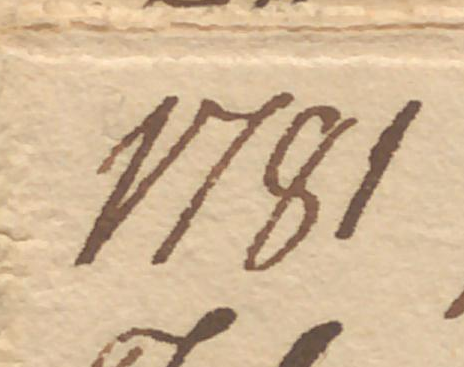1781
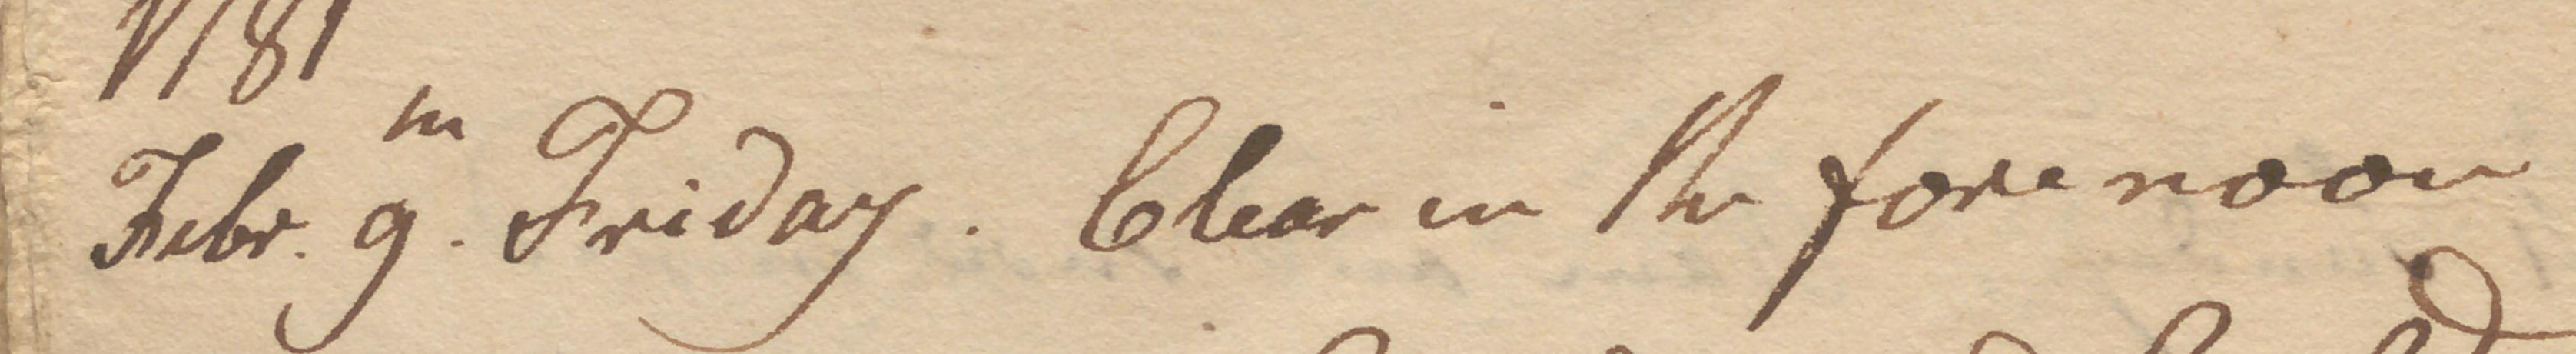Febr. 9^th. Friday. Clear in the forenoon
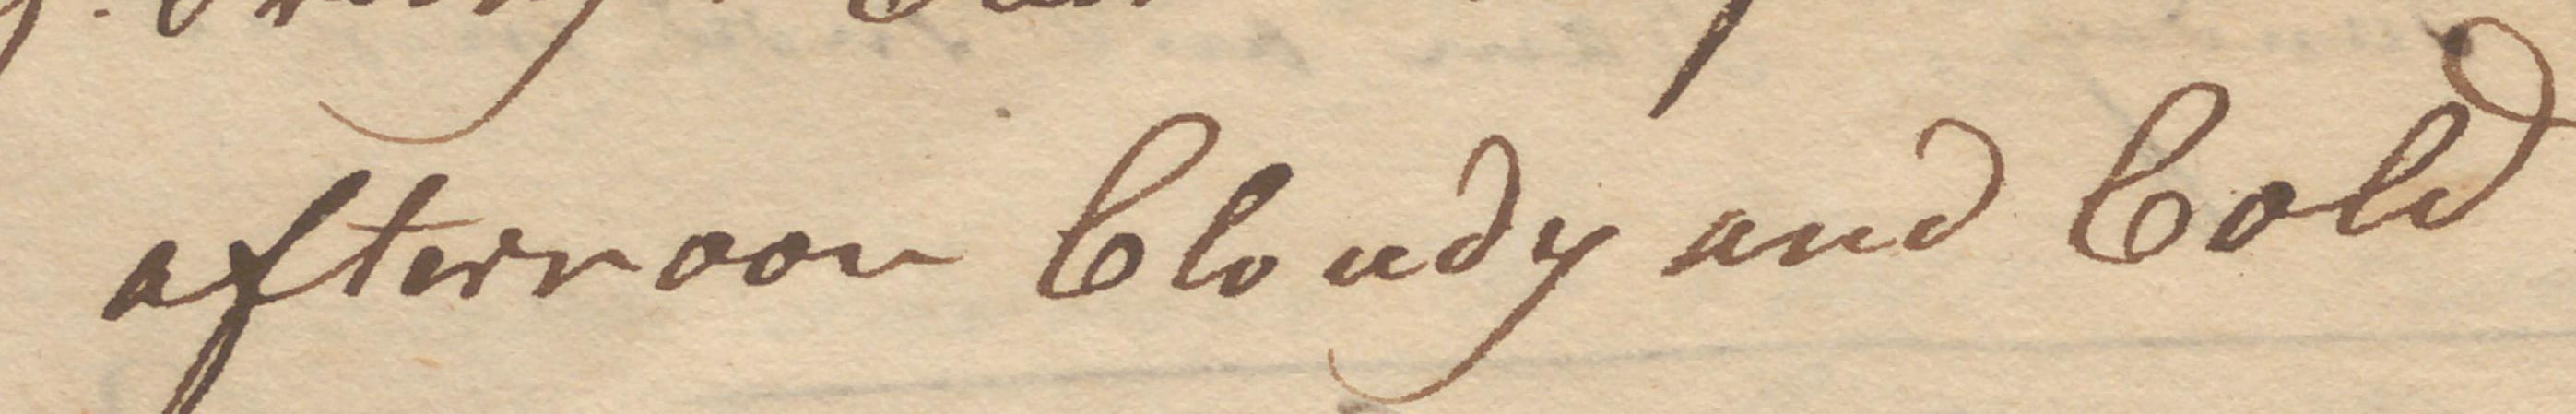afternoon Cloudy and Cold
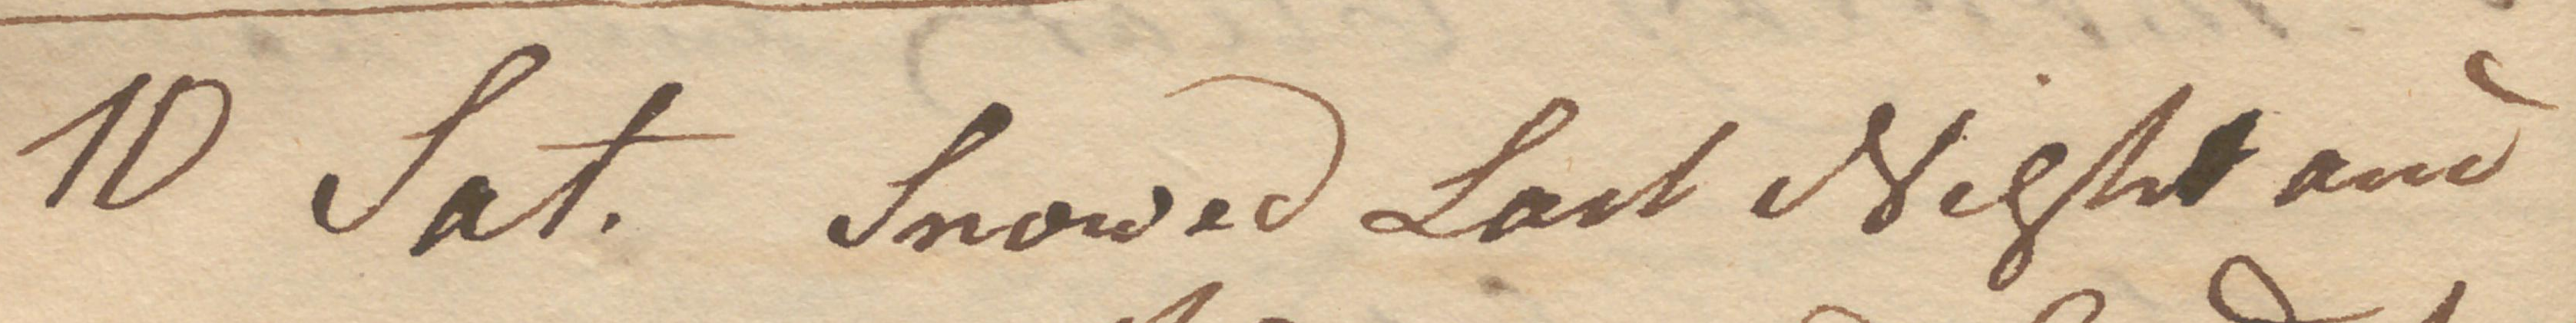10 Sat. Snowed Last Night and
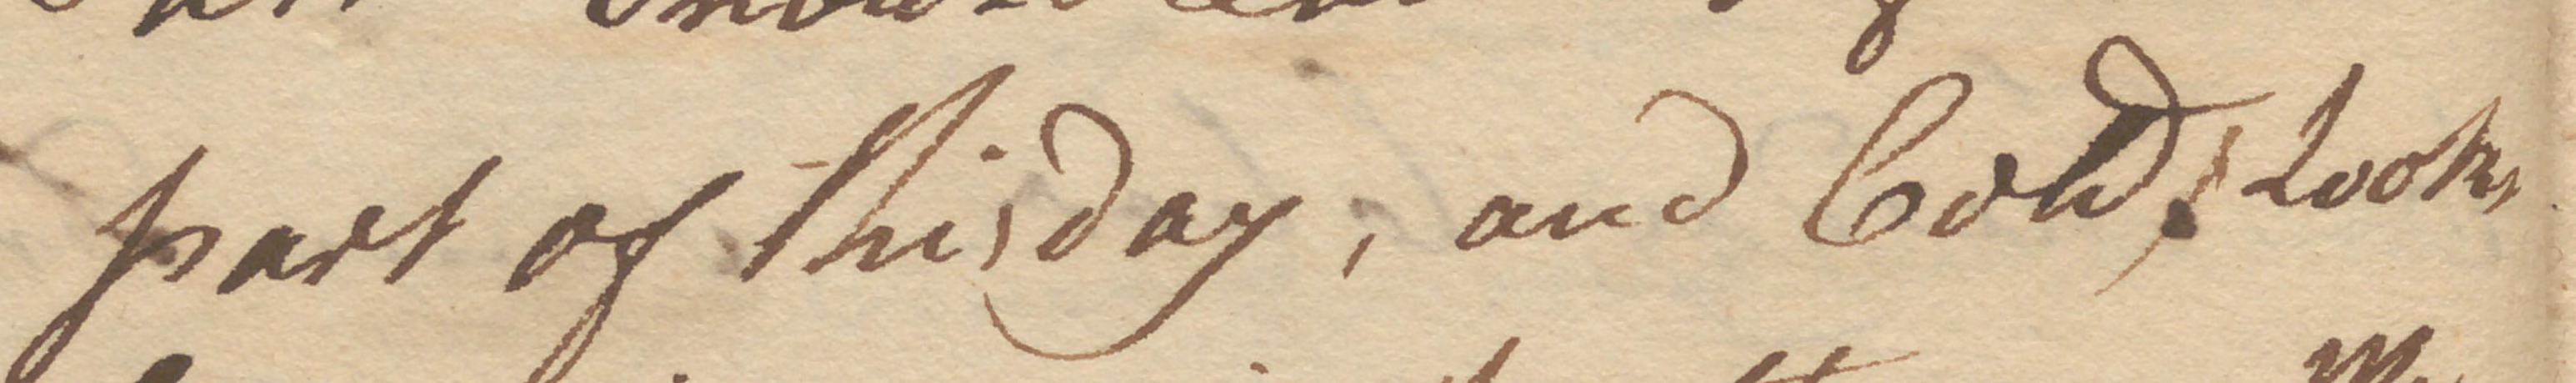part of this day, and Cold. Looks
